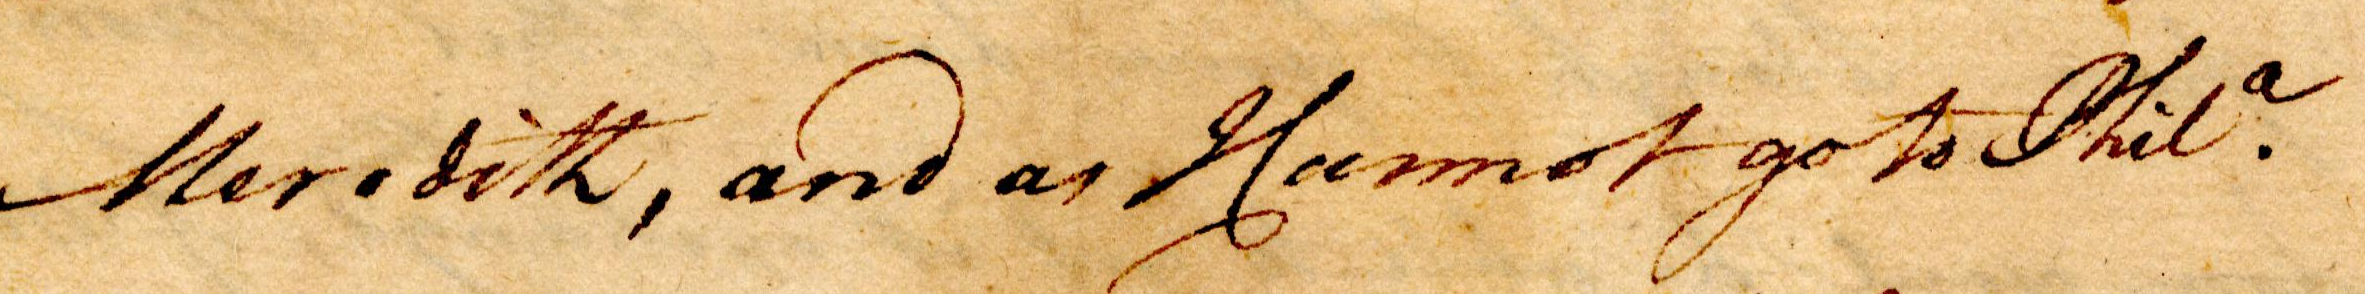Meredith, and as I Cannot go to Phil^a.
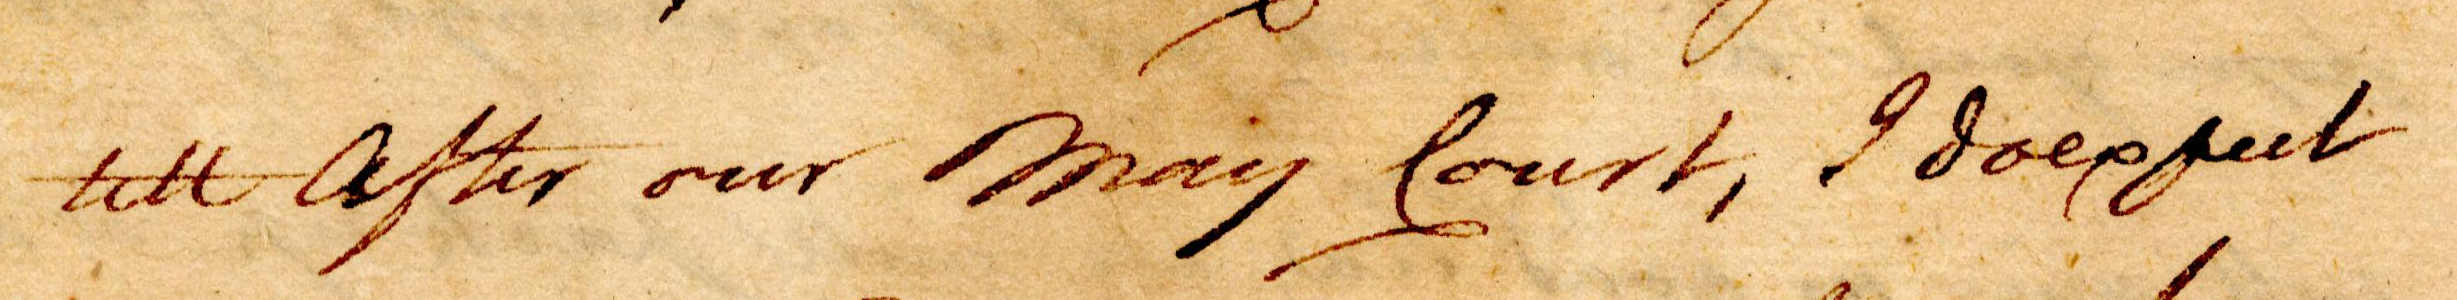till After our May Court, I do expect
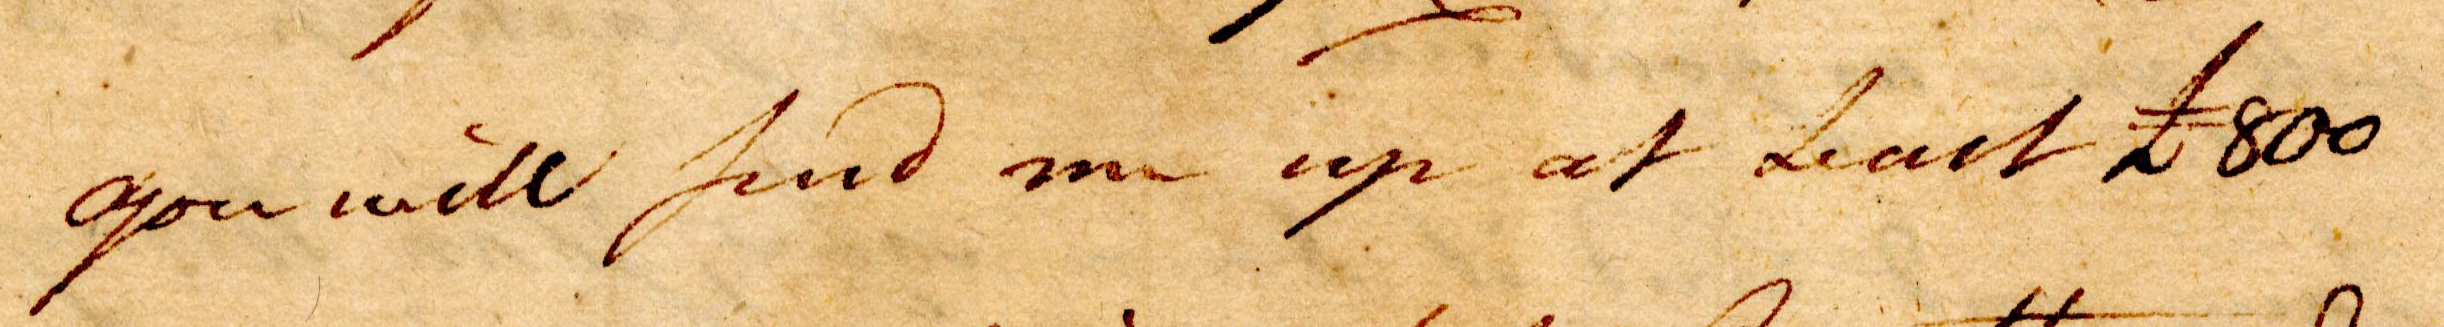you will find me up at Least £800
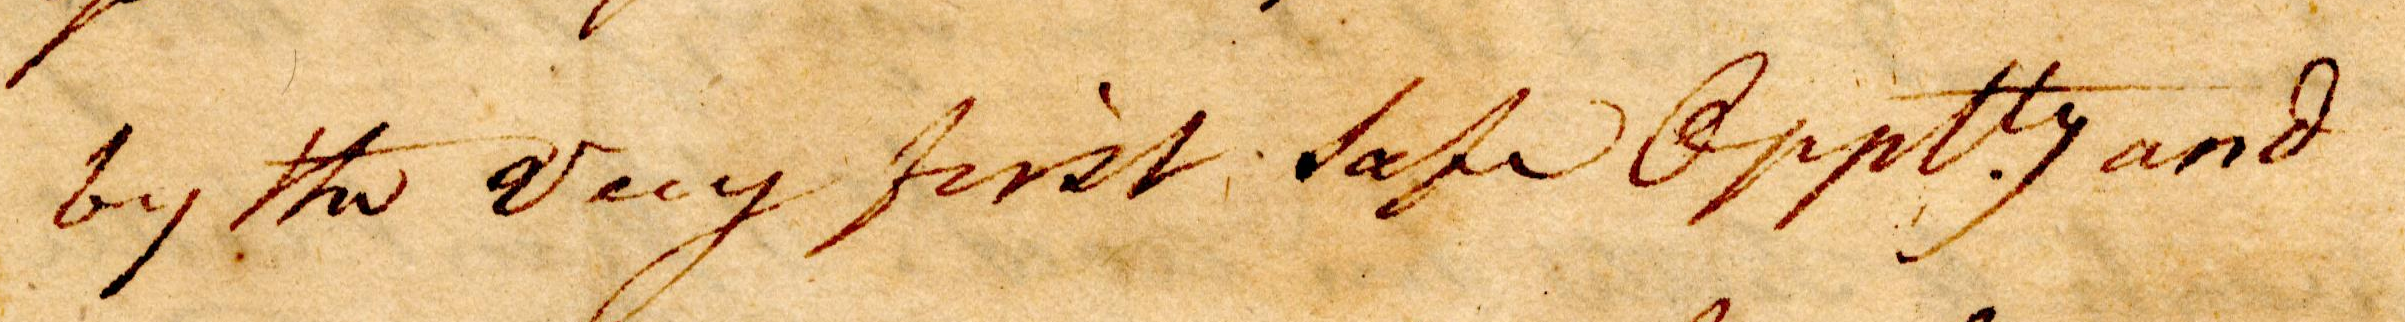by the Very first safe Opp^ty. and
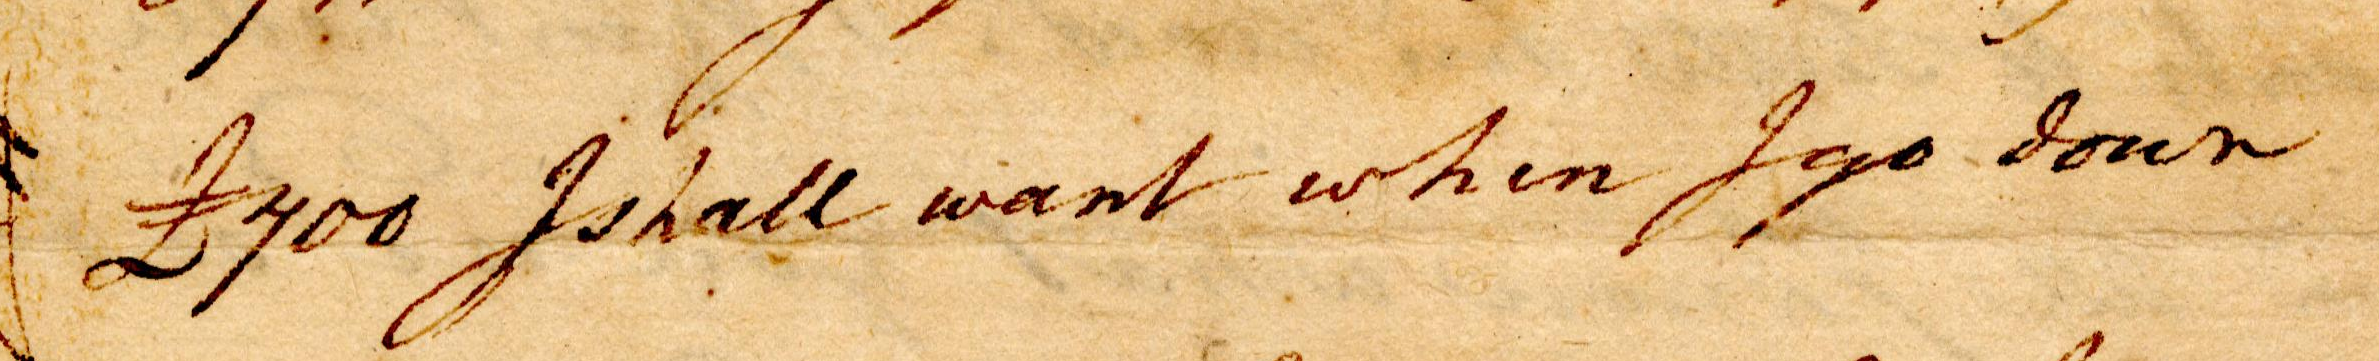£400 I shall want when l go down
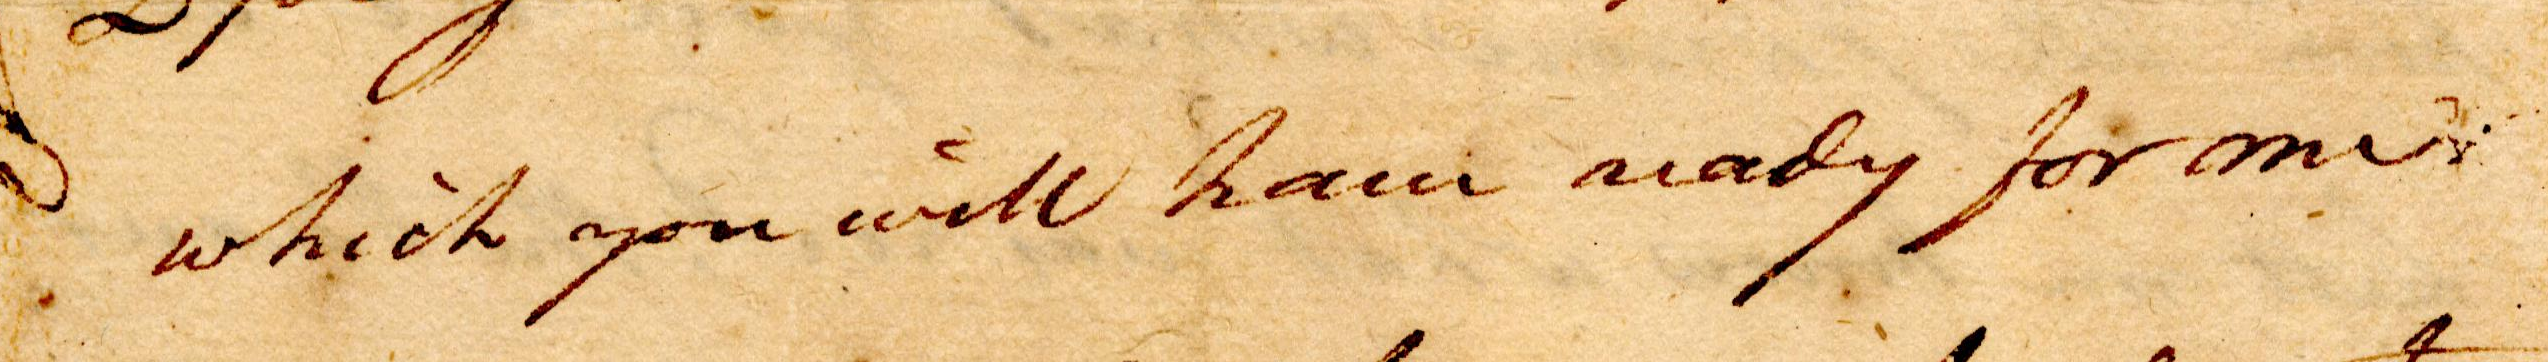which you will have ready for me
